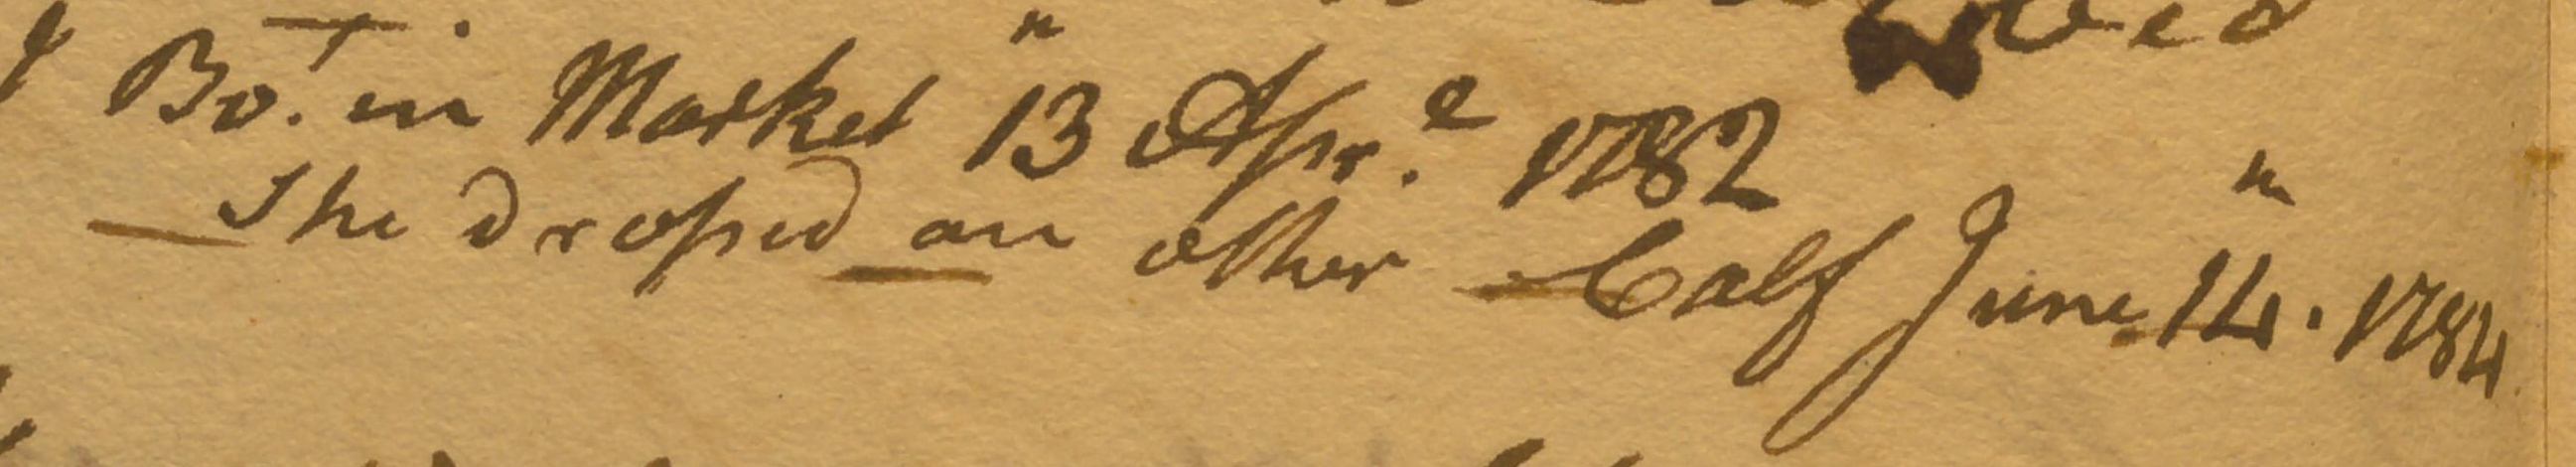she droped an other Calf June 14^th. 1784
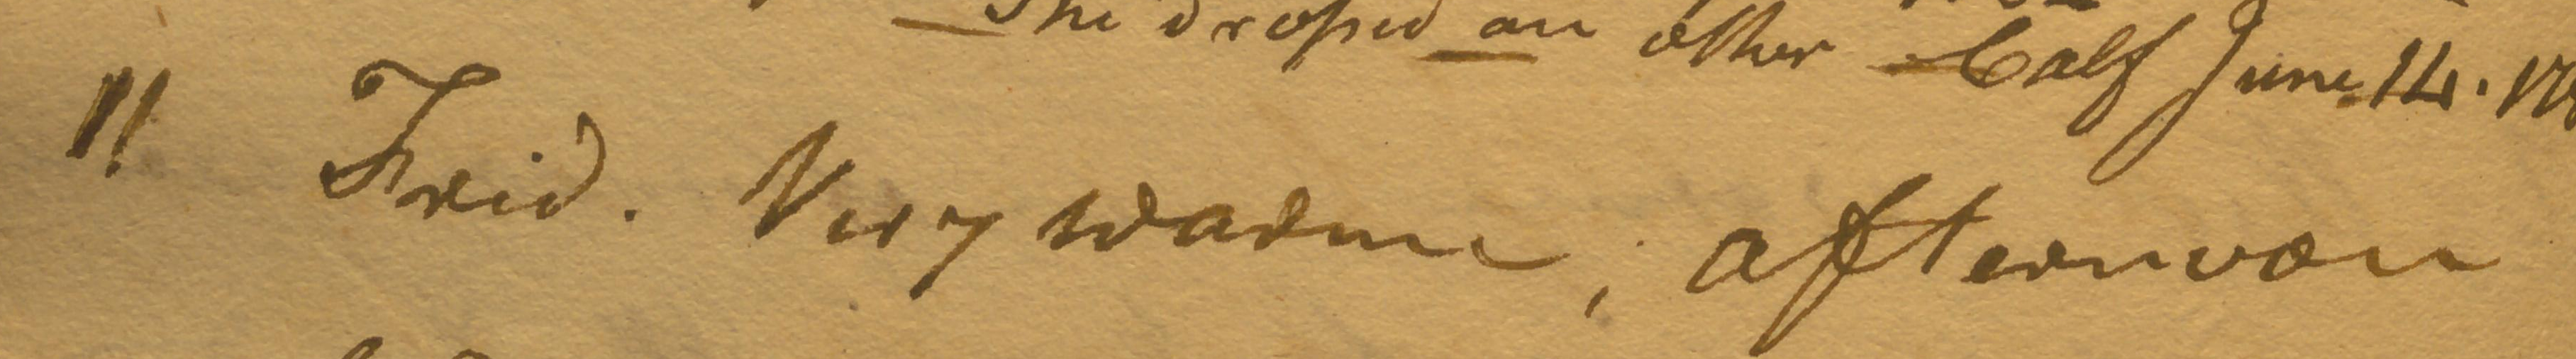11 Frid. Vesy warme afternoon
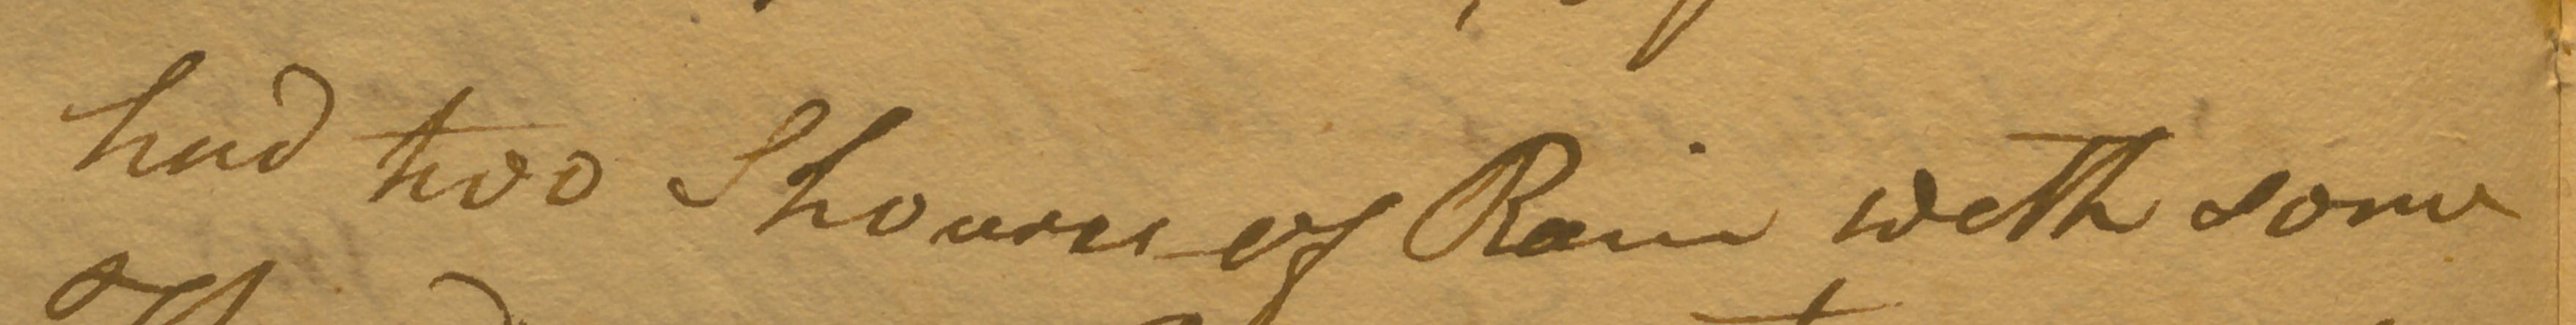had two shoures of Rain with some
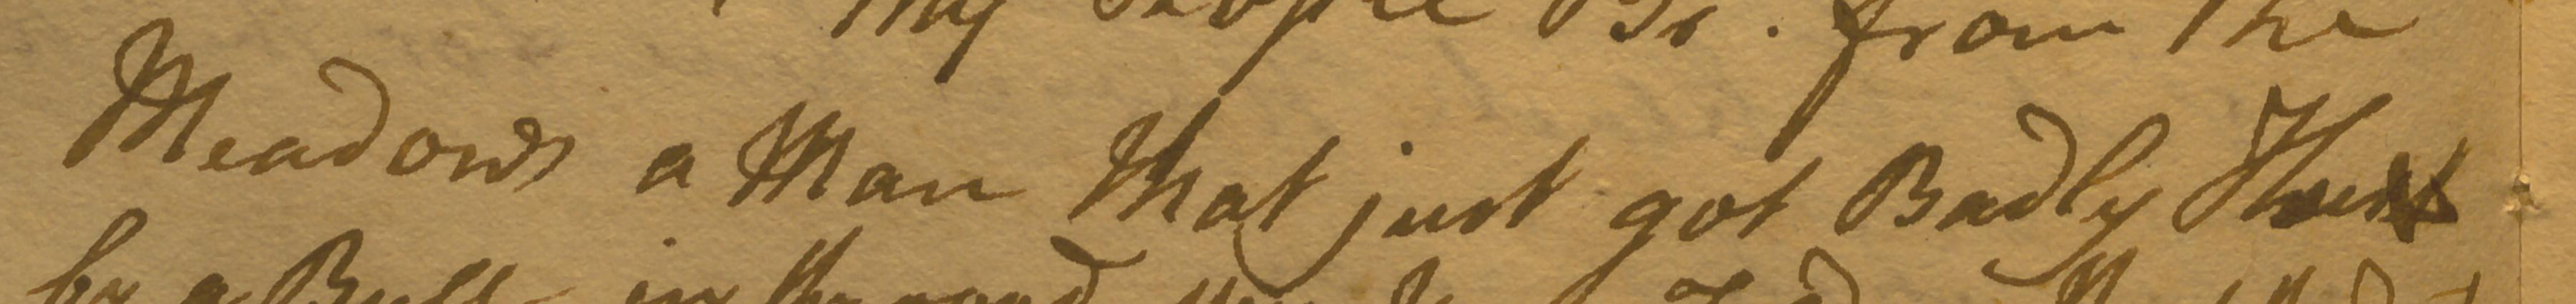Meadows a Man that just got Badly Hurt
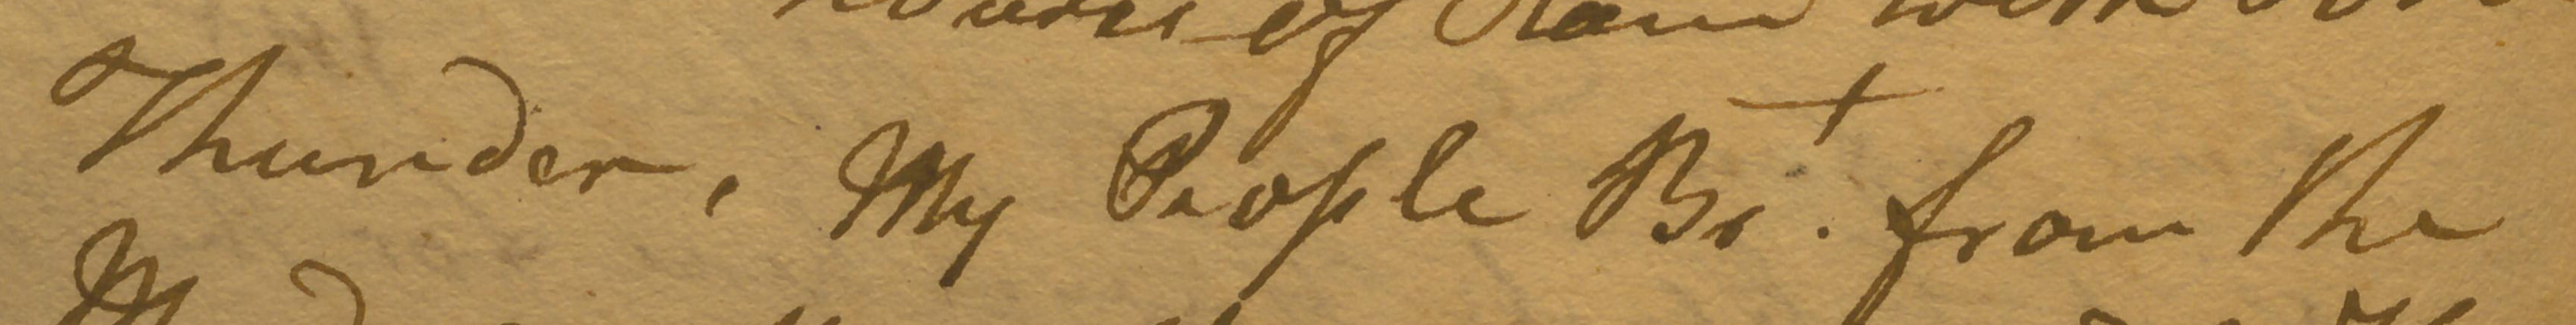Thunder, My People Br^t. from the
